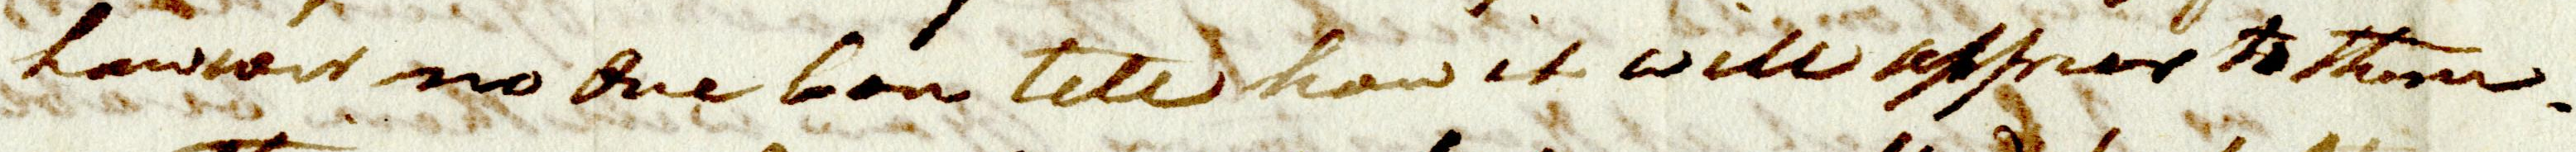however no one can tell how it will appear to them
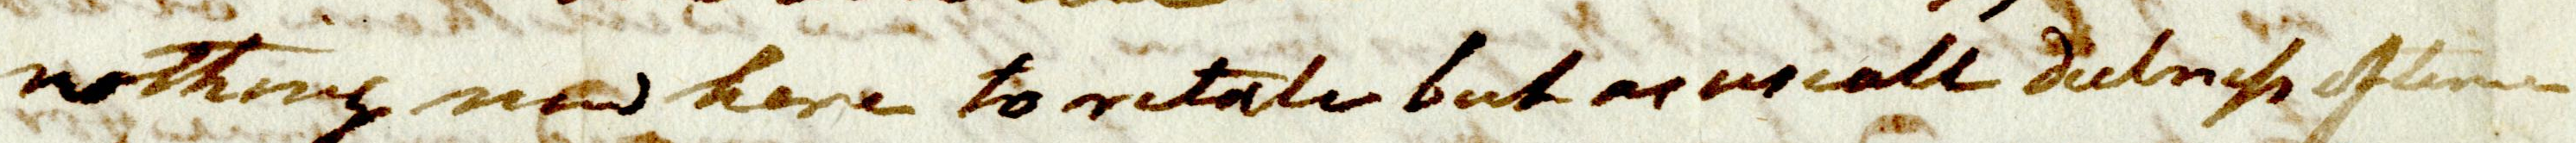nothing new here to retale but as usuall dulness of time
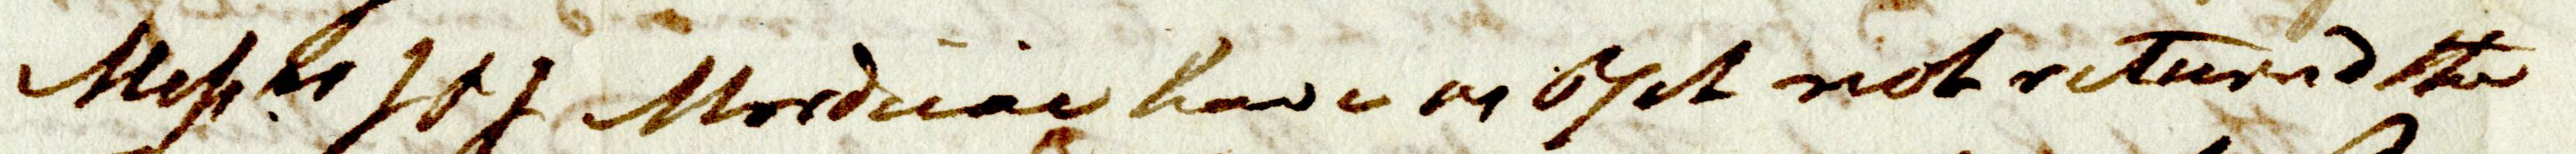Mess^rs. J &J Mordecai have as yet not returnd the
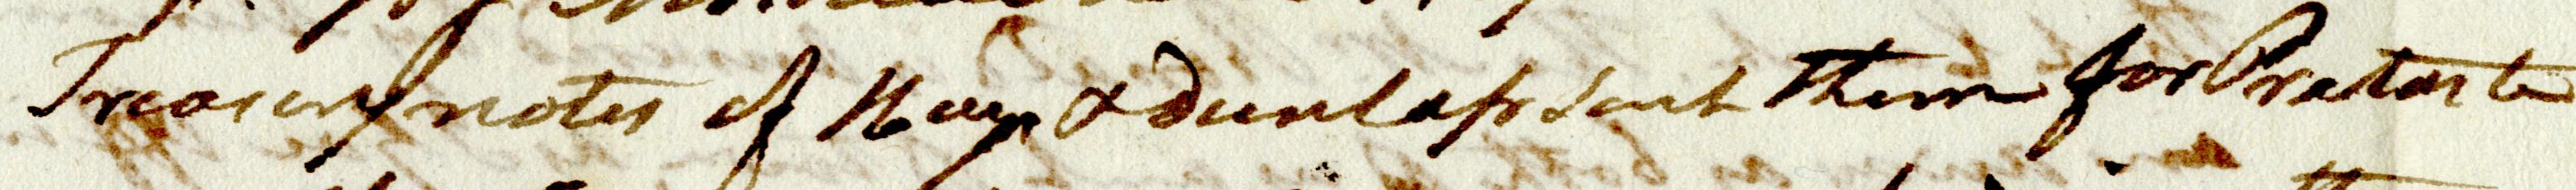Treaty notes of Hay & Dunlap sent them for Pretente
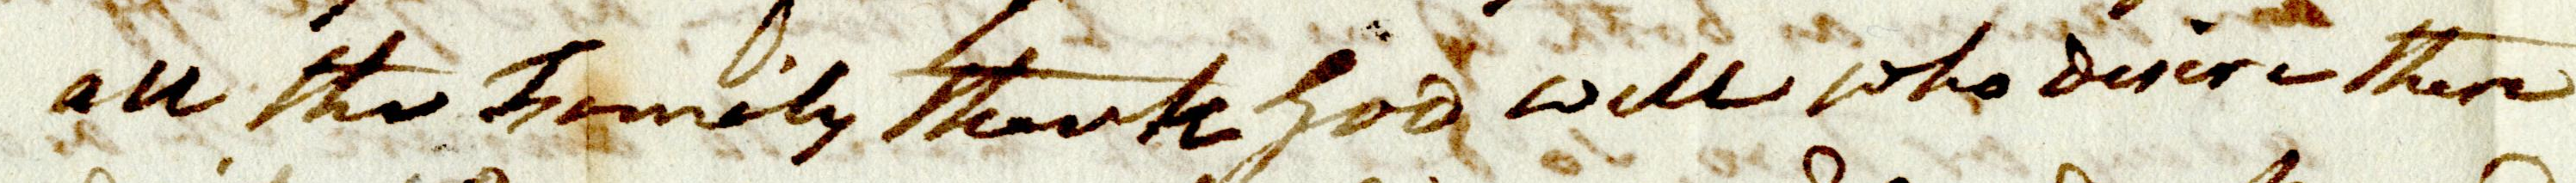all the Family thank God well who desire there
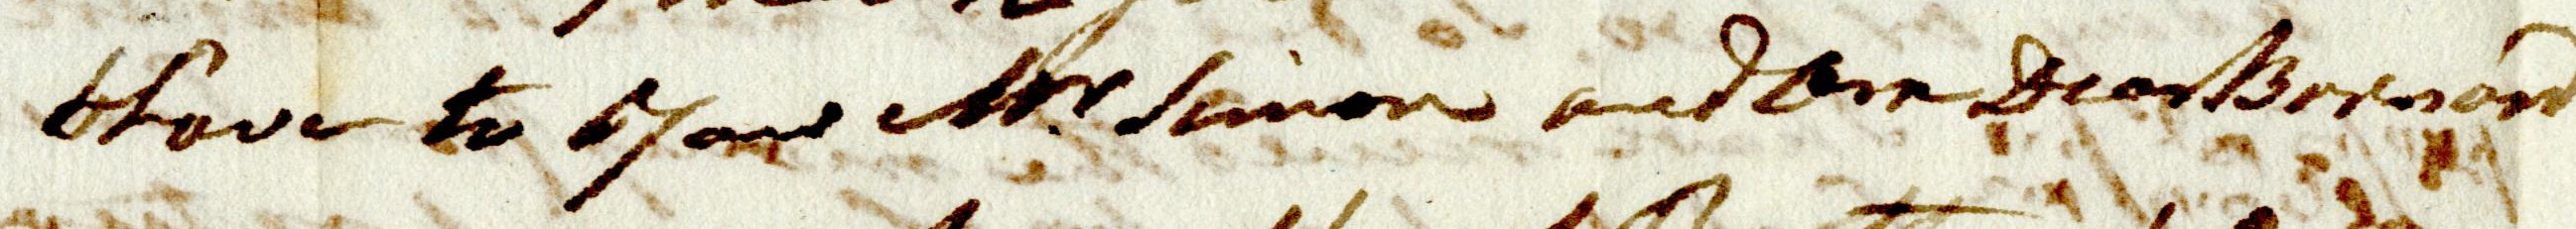& favor to you Mr Simon and are Dear Barnard
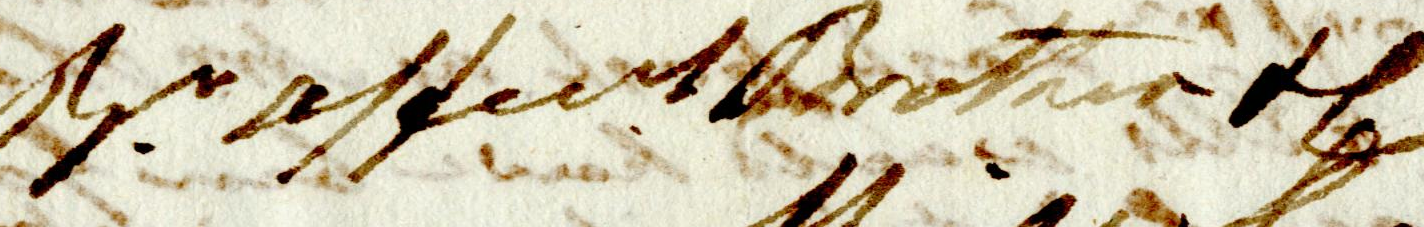Y^r affect Brother H
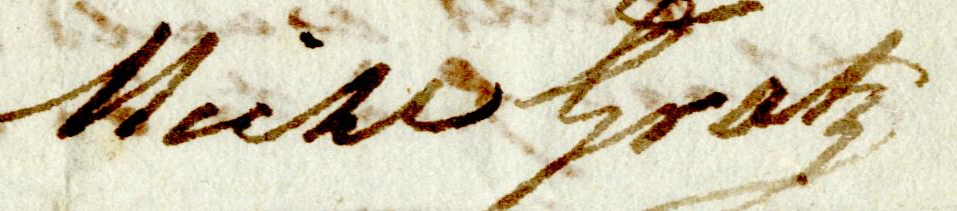Mich^l Gratz
